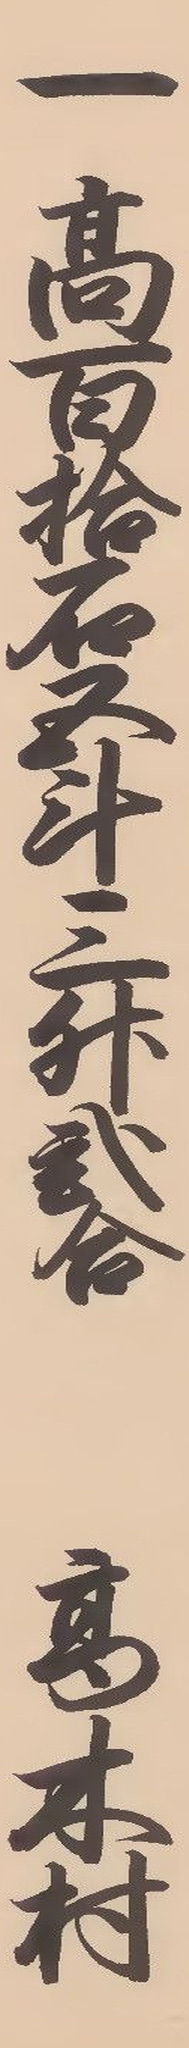一高百拾石五斗三升弐合高木村
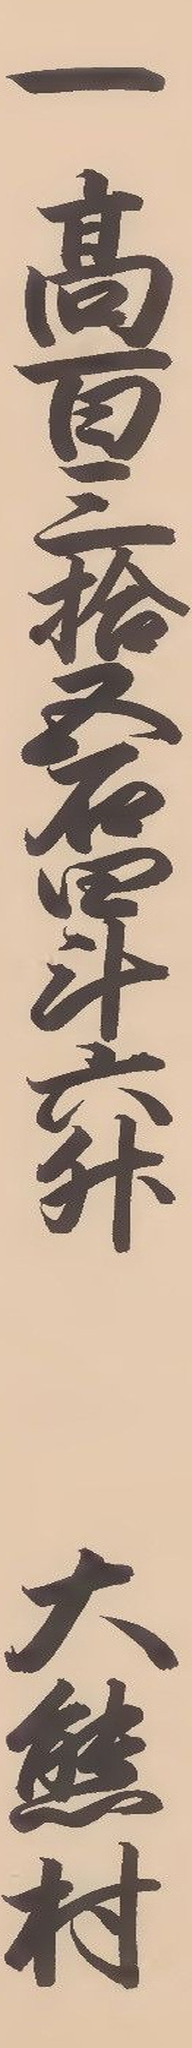一高百三拾五石四斗六升大熊村
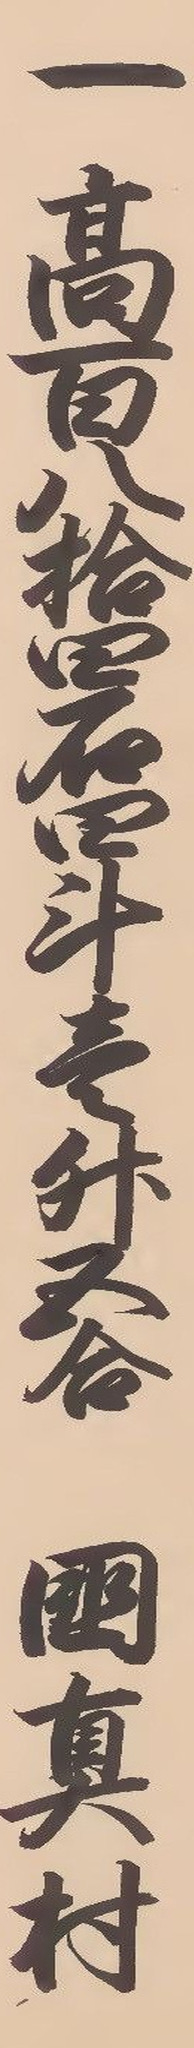一高百八拾四石四斗壱升五合国真村
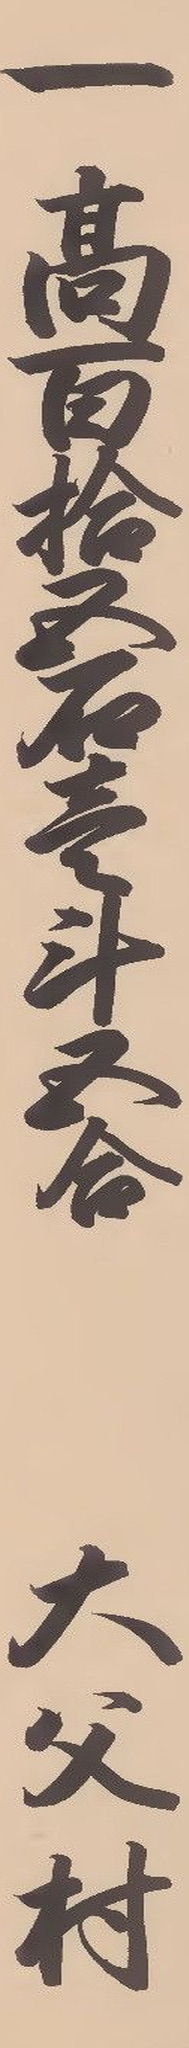一高百拾五石壱斗五合大父村
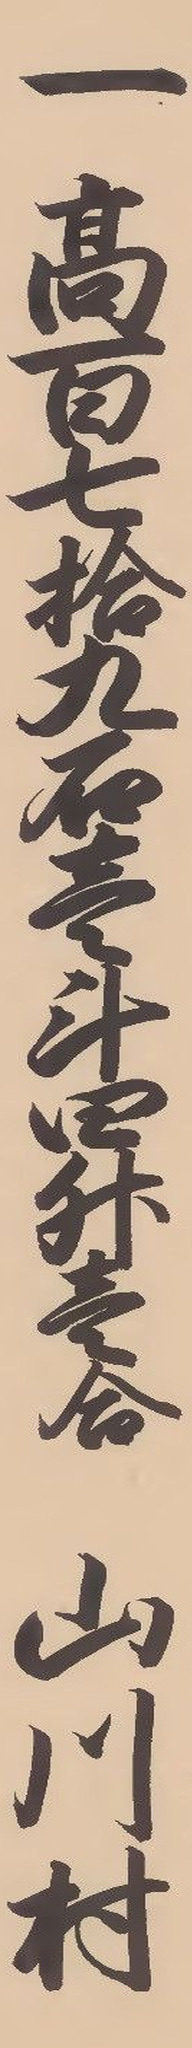一高百七拾九石壱斗四升壱合山川村
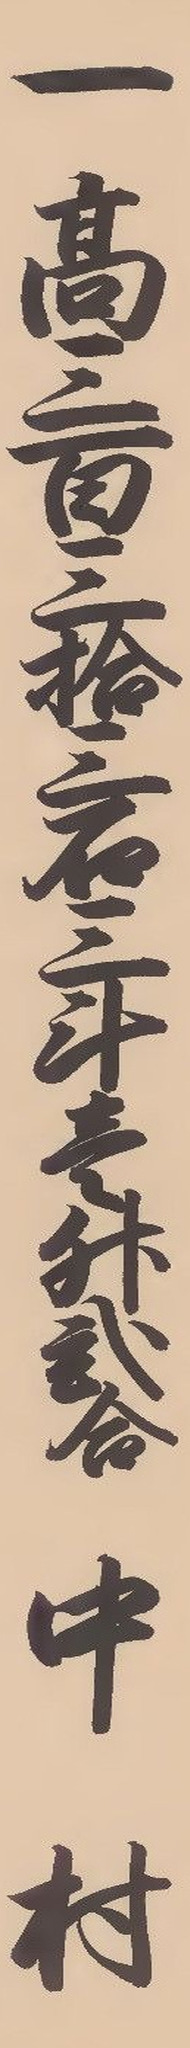一高三百三拾三石三斗壱升弐合中村
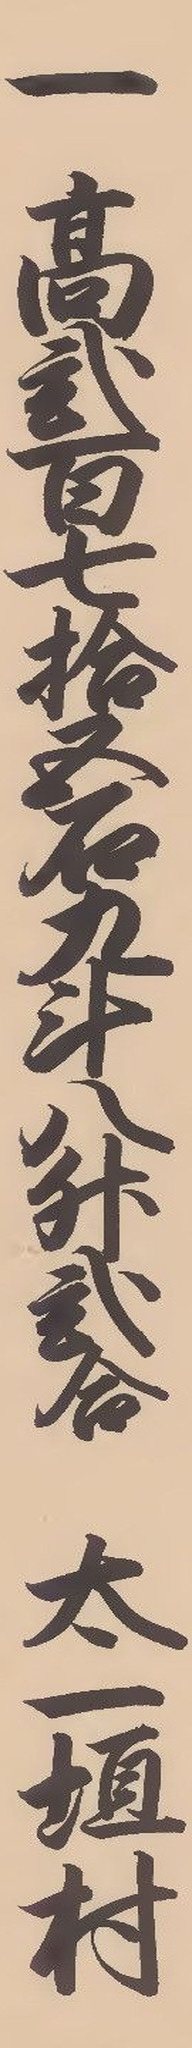一高弐百七拾五石九斗八升弐合太一垣村

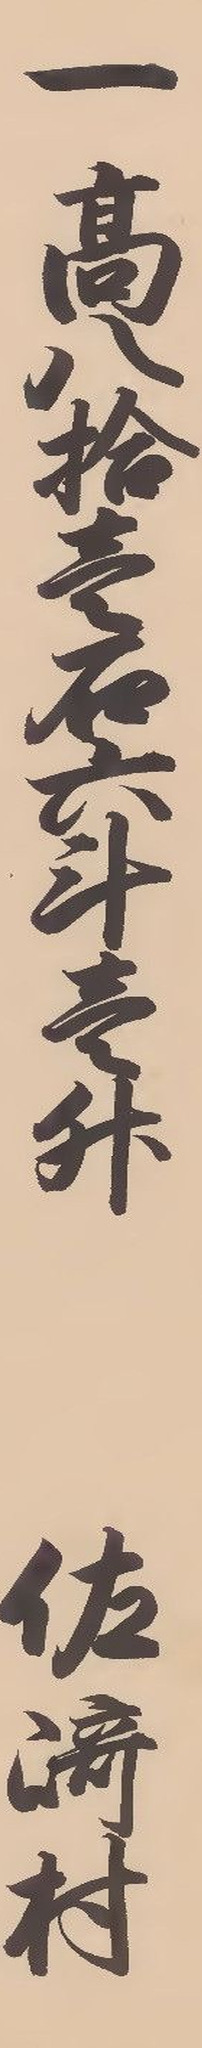一高八拾壱石六斗壱升佐崎村
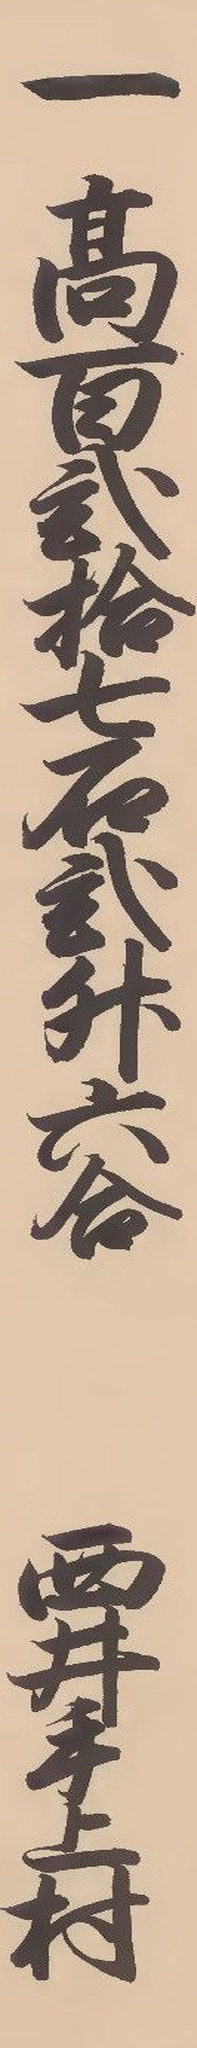一高百弐拾七石弐升六合西井手上村
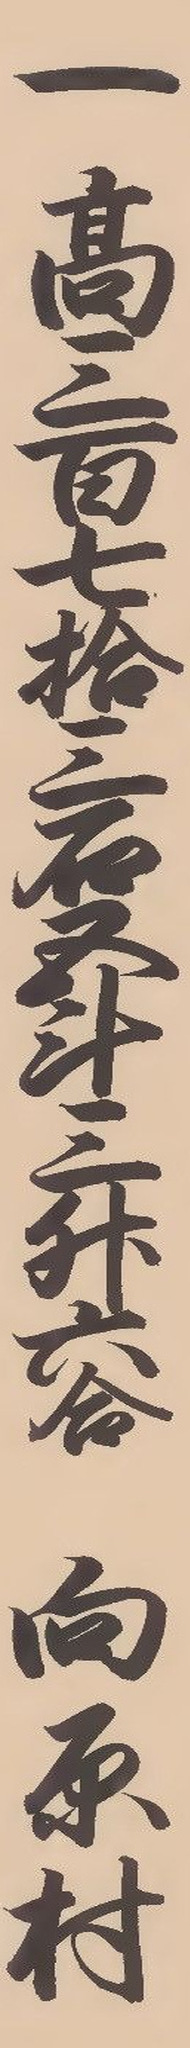一高三百七拾三石五斗三升六合向原村
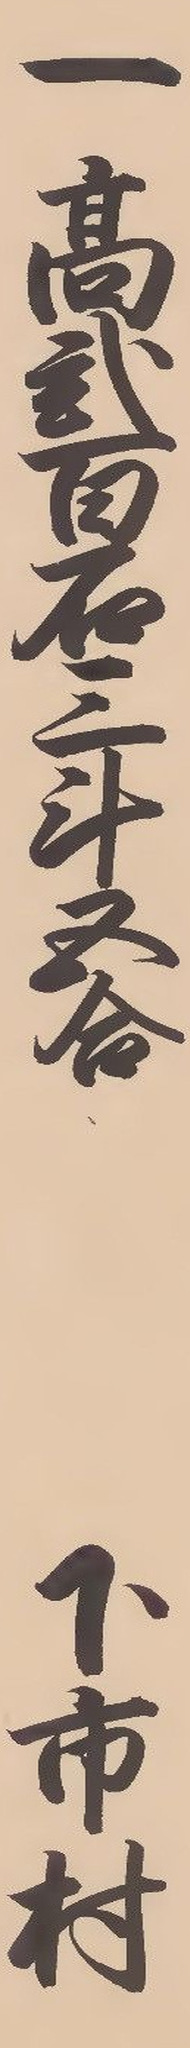一高弐百石三斗五合下市村
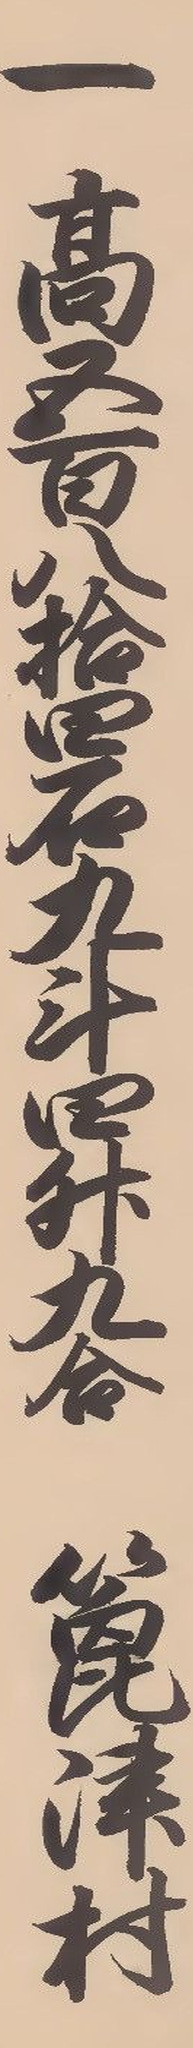一高五百八拾四石九斗四升九合箆津村
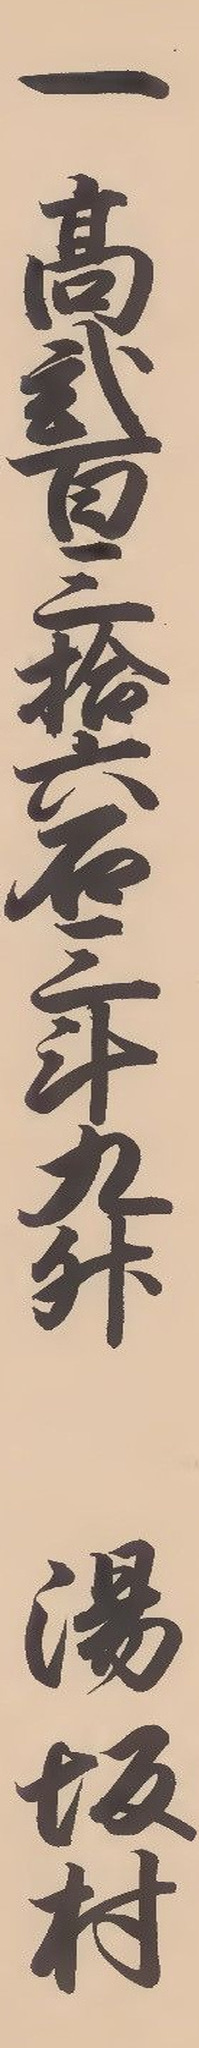一高弐百三拾六石三斗九升湯坂村
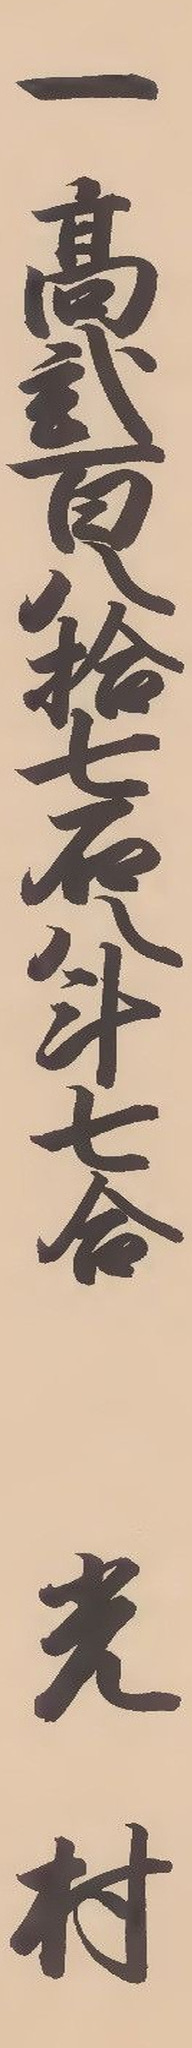一高弐百八拾七石八斗七合光村
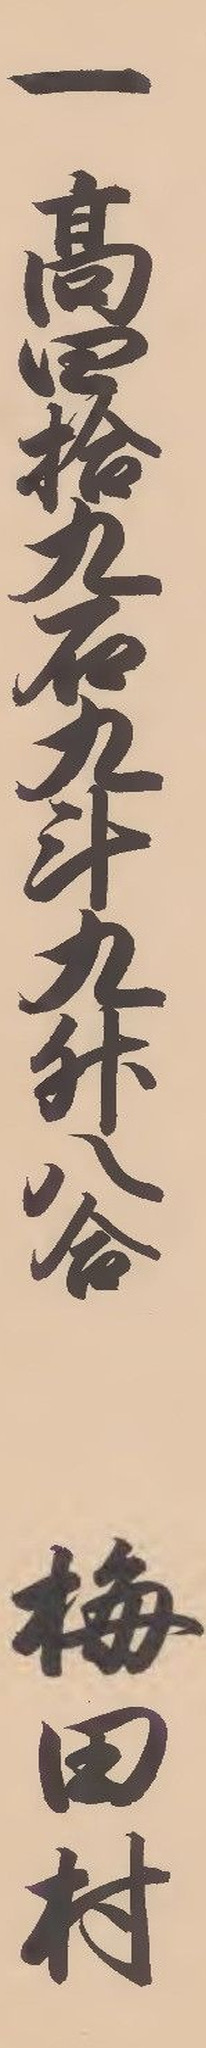一高四拾九石九斗九升八合梅田村

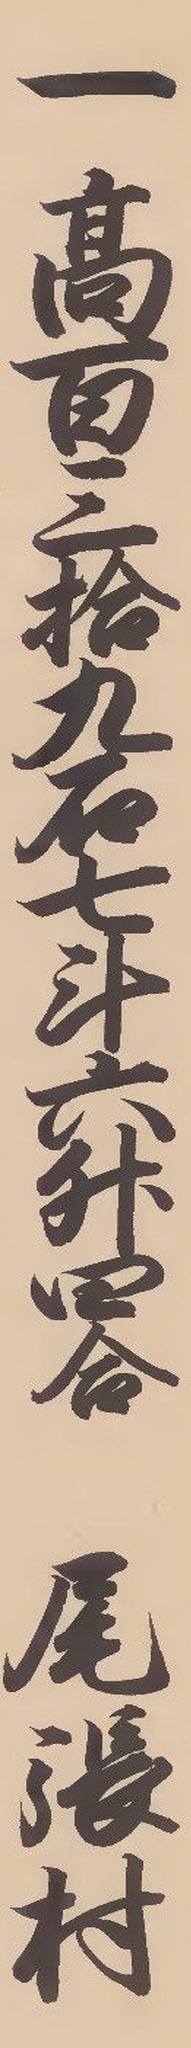一高百三拾九石七斗六升四合尾張村
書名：伯耆国郷帳
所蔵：国立公文書館 National Archives of Japan
